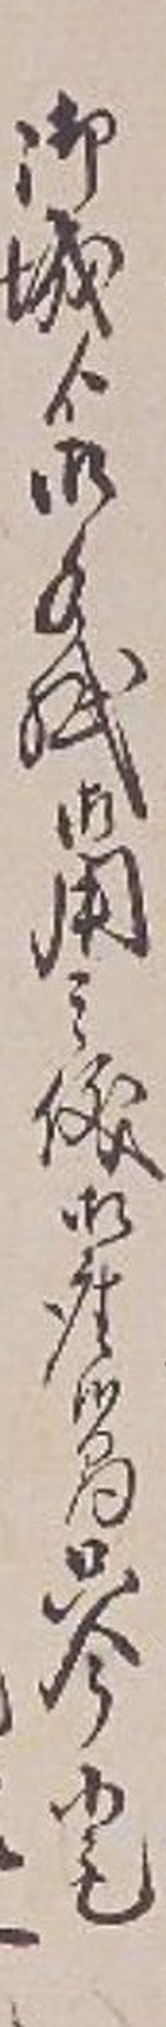御城ゟ御手紙御用之儀御座候間只今登
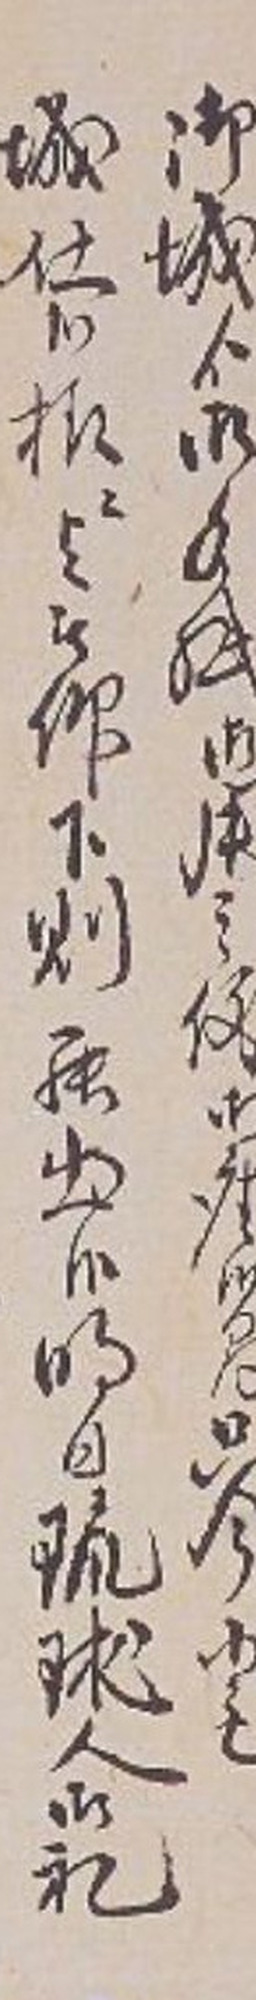城仕候様にと被仰下則罷出候明日琉球人御礼
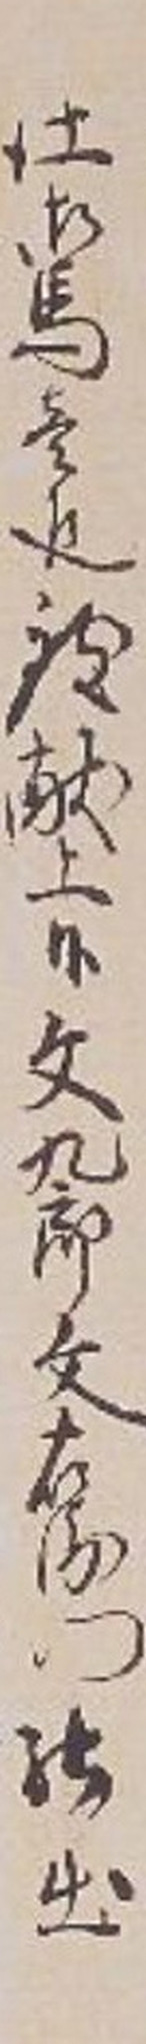仕御馬壱疋致献上候文九郎文右衛門罷出
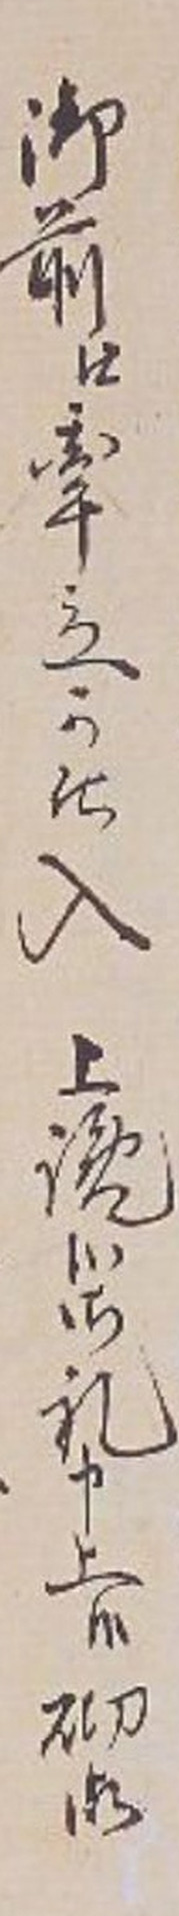御前え牽立可被入上覧候御礼申上候砌御
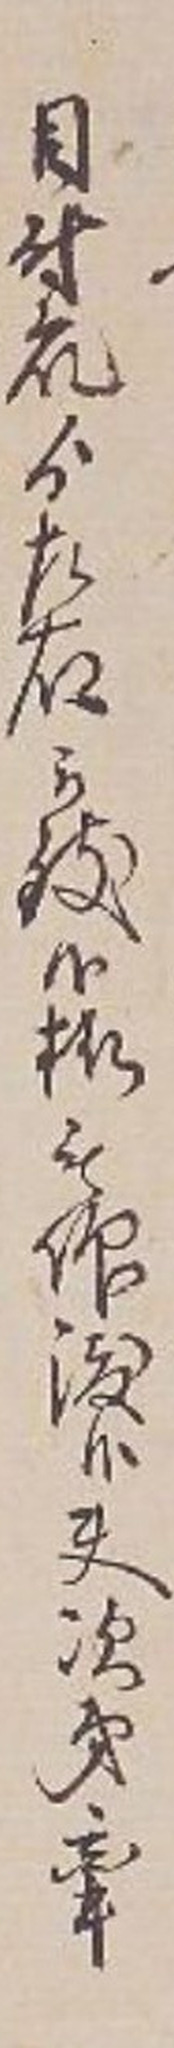目付衆ゟ左右被致候様被仰渡候夫次第牽
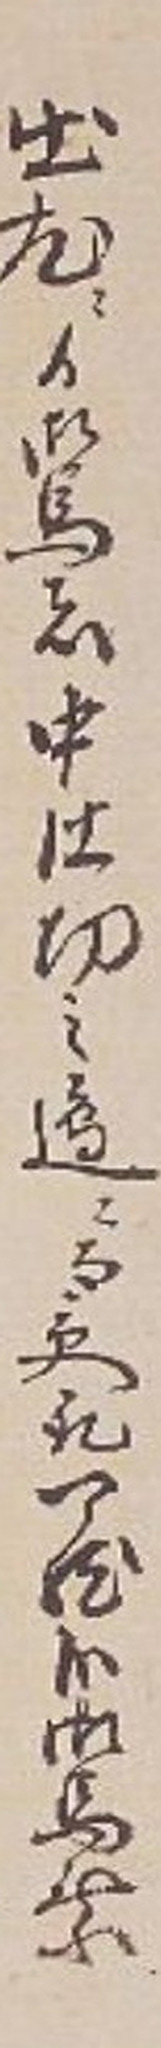出尤に候御馬は中仕切之辺に而受取可然候御馬乗
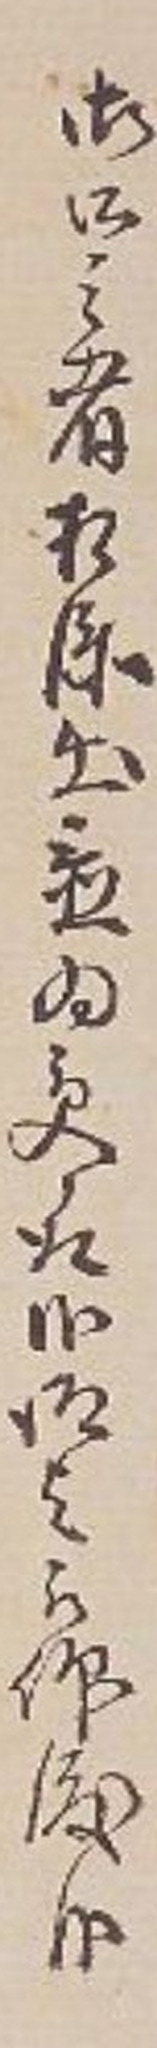御口之者相添出置為受取候得と被仰渡候
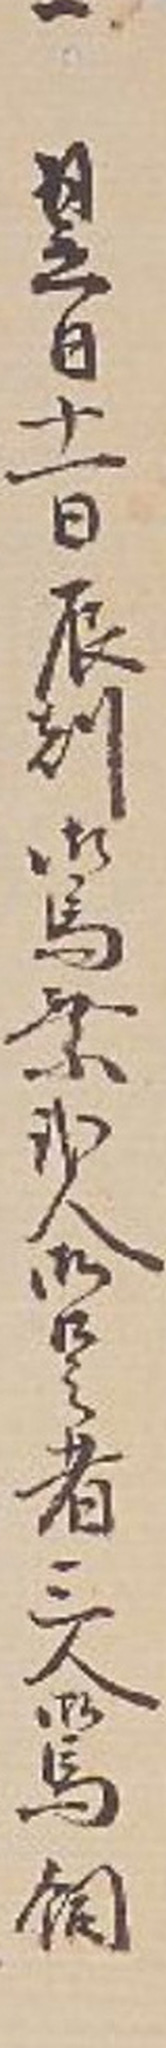一翌日十一日辰刻御馬乗弐人御口之者三人御馬飼
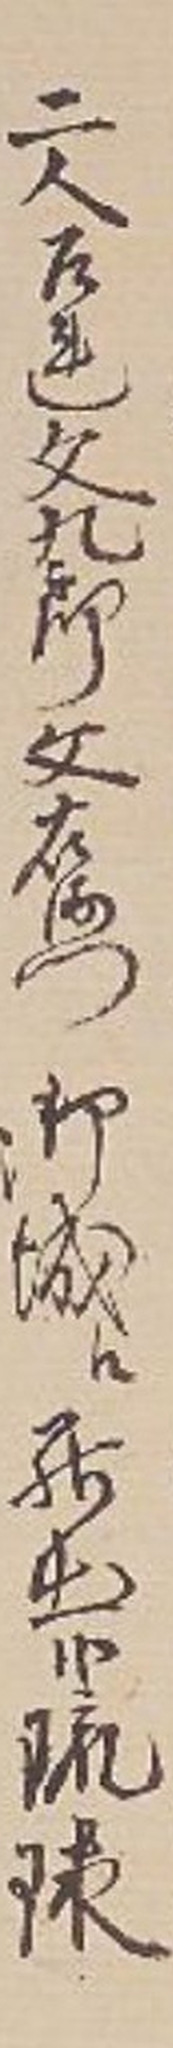二人召連文九郎文右衛門御城え罷出候琉球
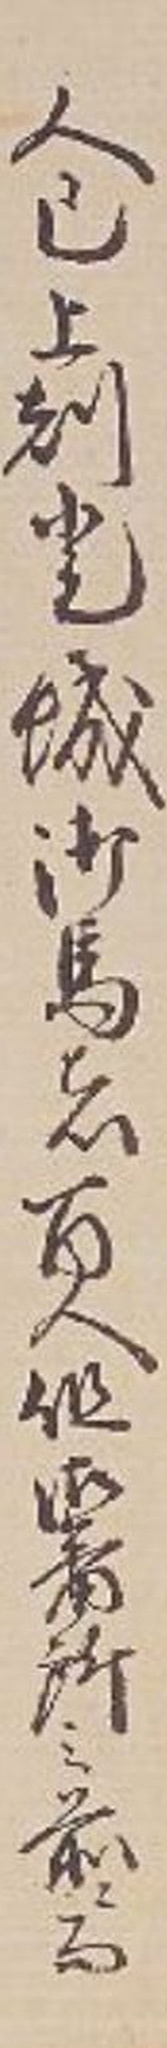人巳上刻登城御馬は百人組御番所之前に而
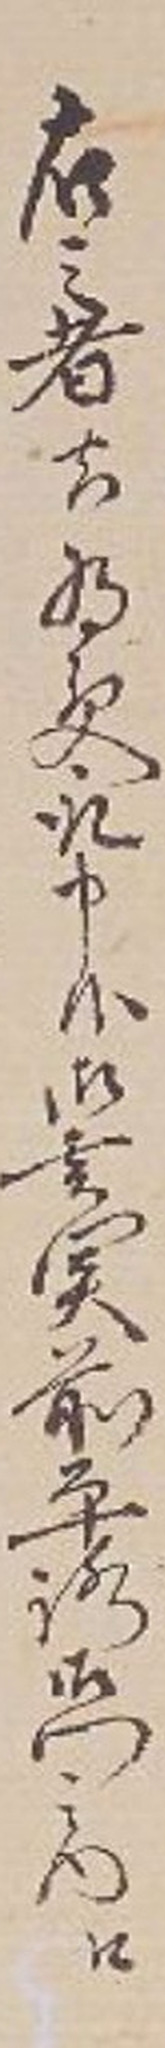右之者共為受取申候御玄関前平路御門之内え
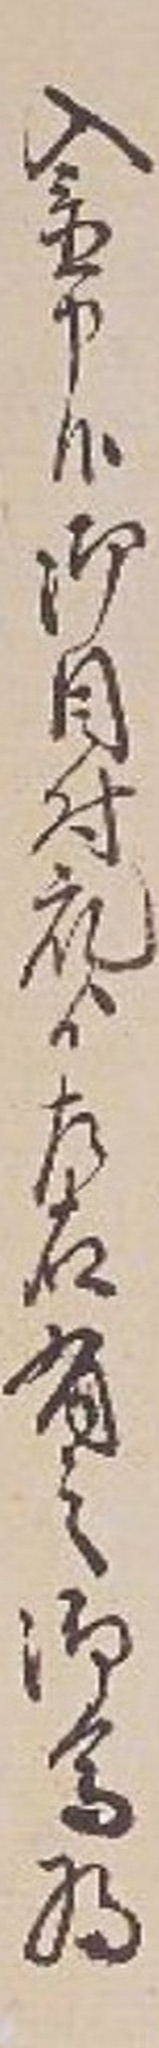入置申候御目付衆ゟ左右有之御馬為
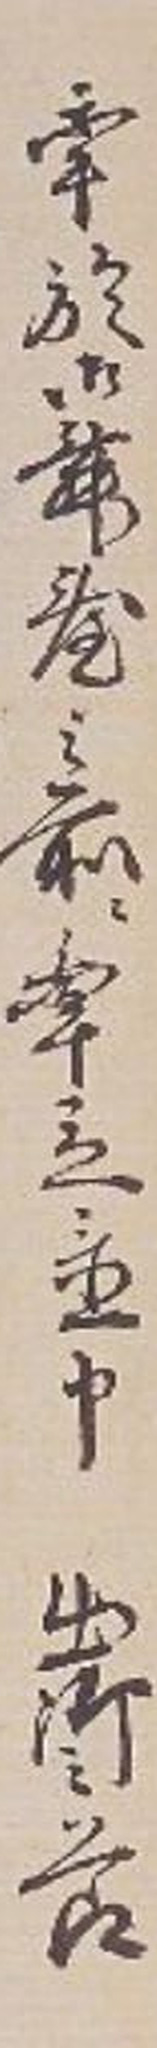牽於御舞台之前に牽立置申出御之節
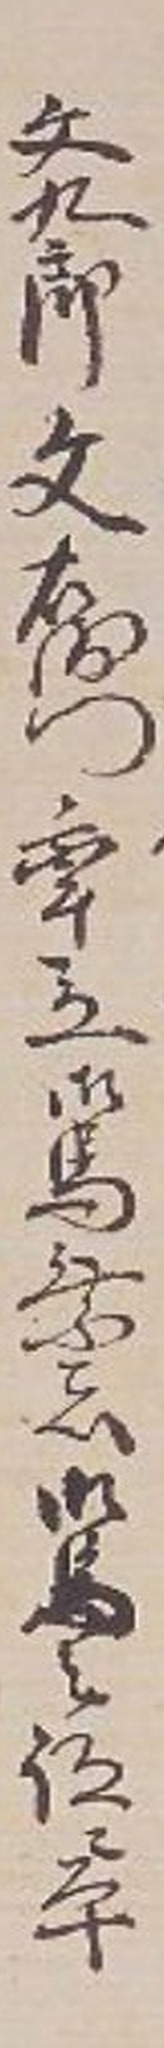文九郎文右衛門牽立御馬乗者御馬之跡に平
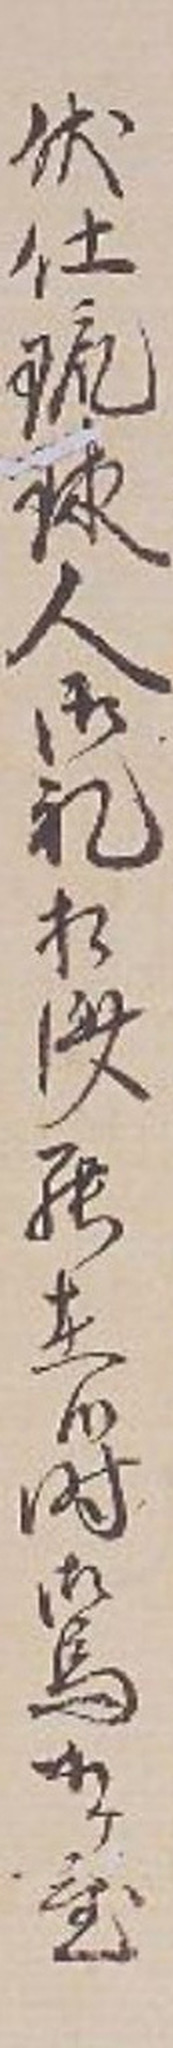伏仕琉球人御礼相済罷在候時御馬下ヶ置

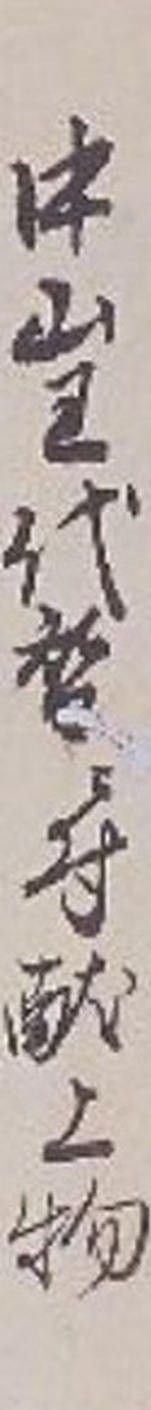中山王代替に付献上物
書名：宝永七年 琉球人来聘
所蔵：University of the Ryukyus Library
